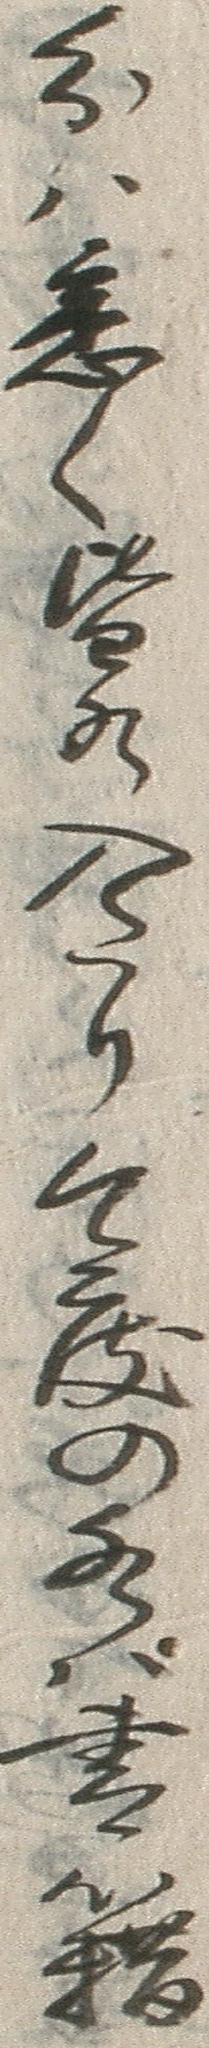分ハ悉く皆水入たり今度の水は書籍
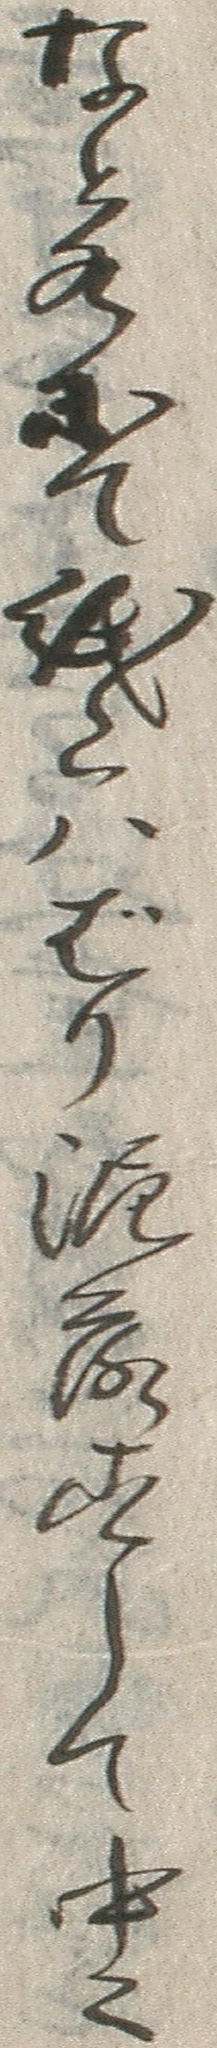なと水にて紙こはばり泥落すして中々
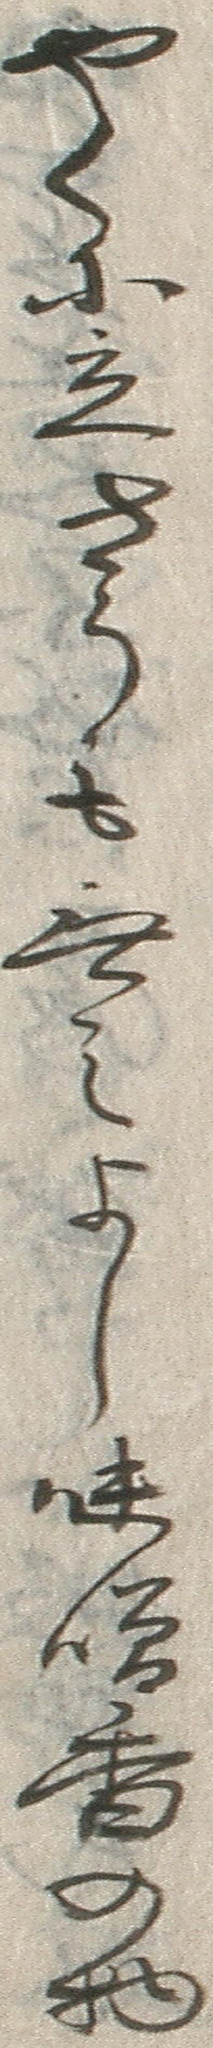やくに立さうも無之よし味噌香の物
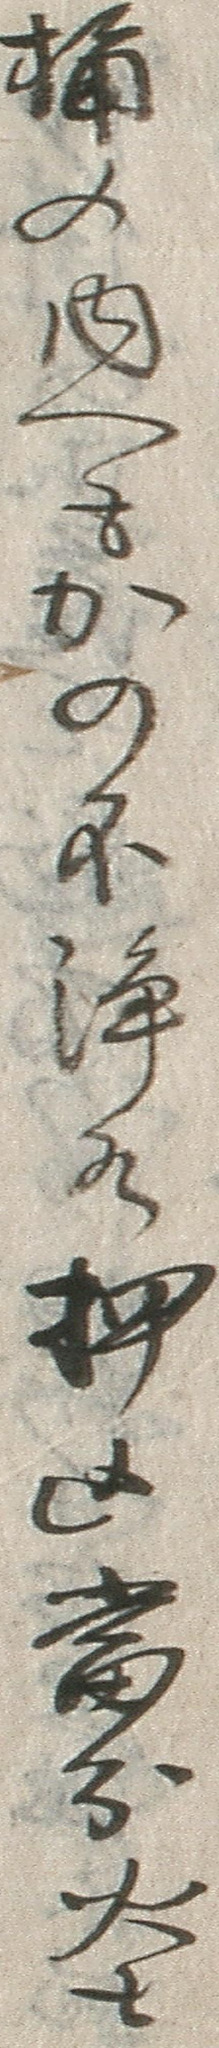桶の内へもかの不浄水押込当分火も
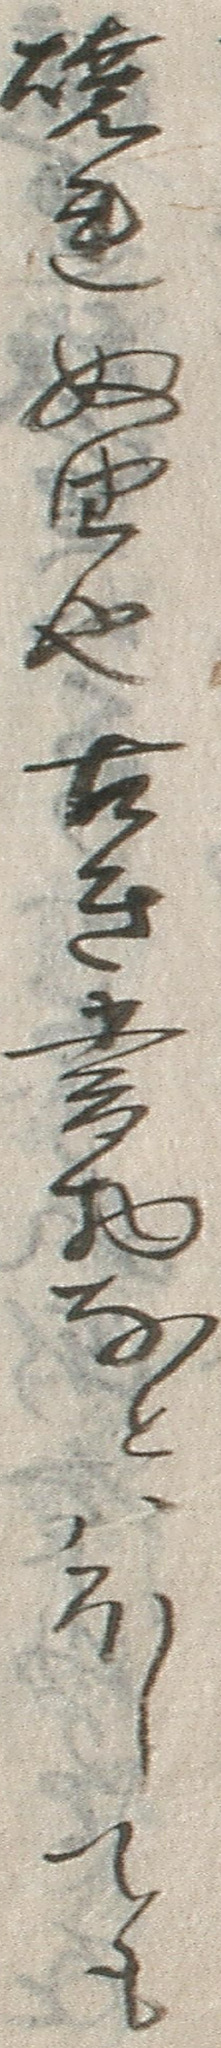焼れぬ由也古き書物なとはほしても
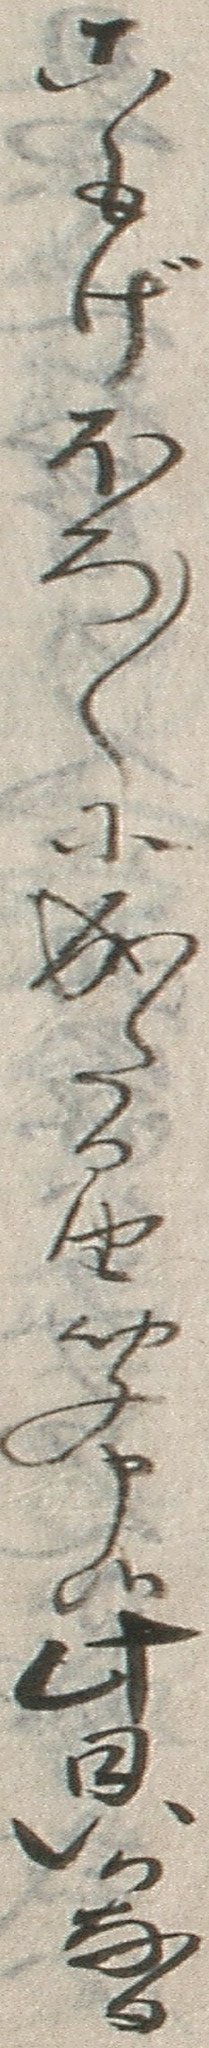古もげほろ〳〵に成たる由聞申候此日いかなる

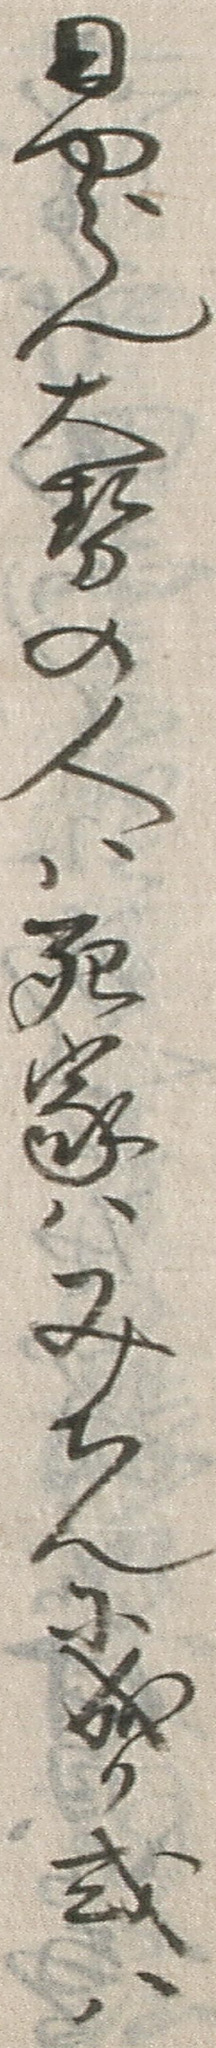日やらん大勢の人は死家はみちんに成り或は
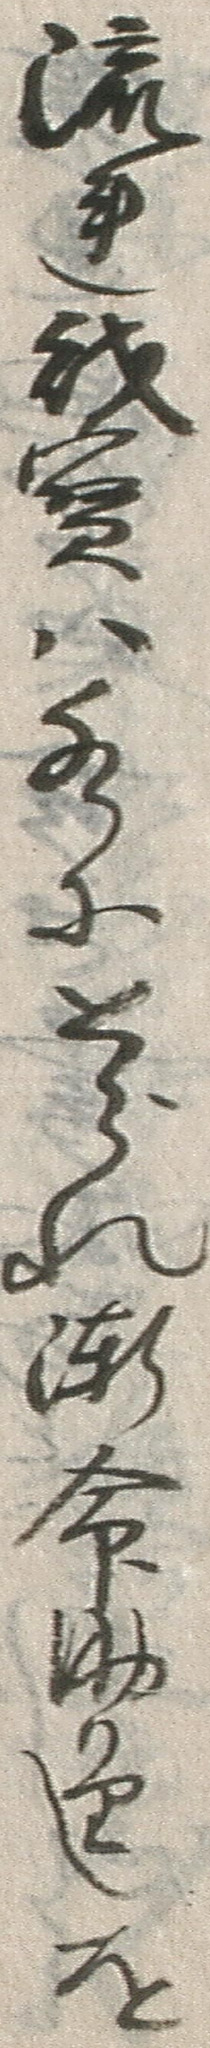流れ財宝は水にとられ漸命助かりしを
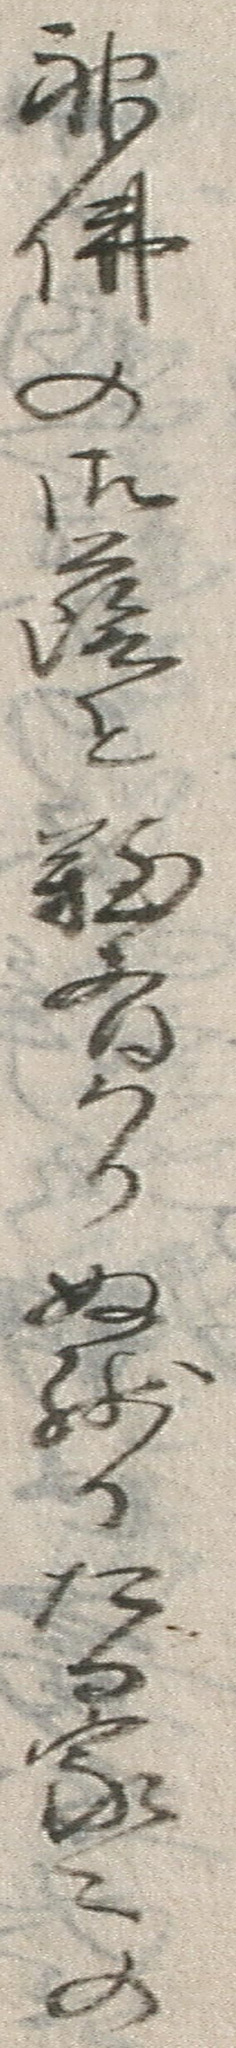神仏の御蔭と難有かりぬ残りたる家々の
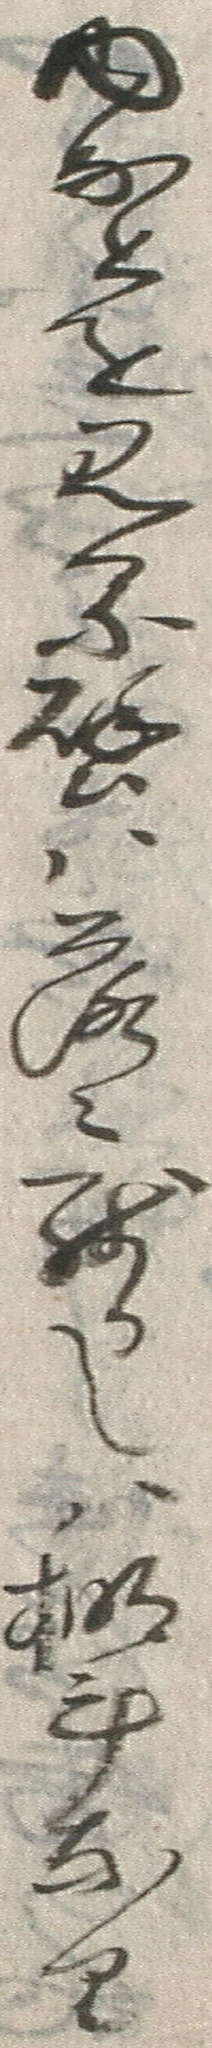内なとを見るに壁は落々残りしは棚斗なり
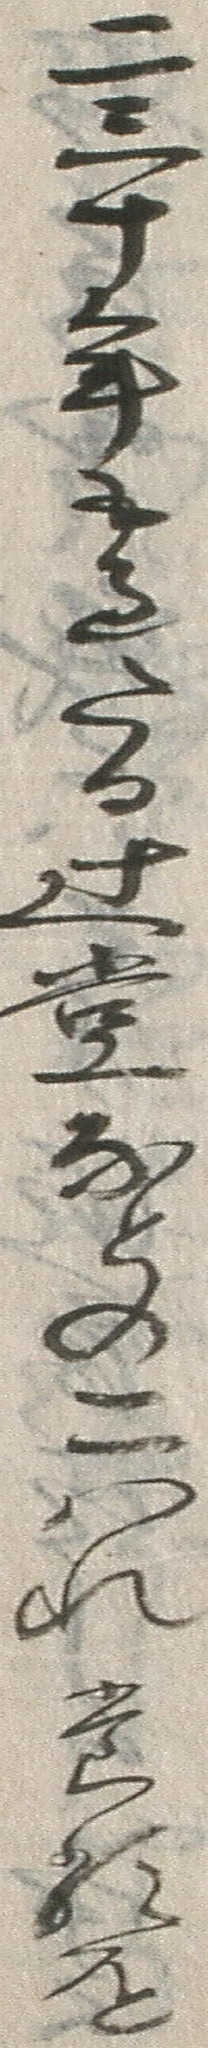二三十年も過たる辻堂なとのこはれたるを
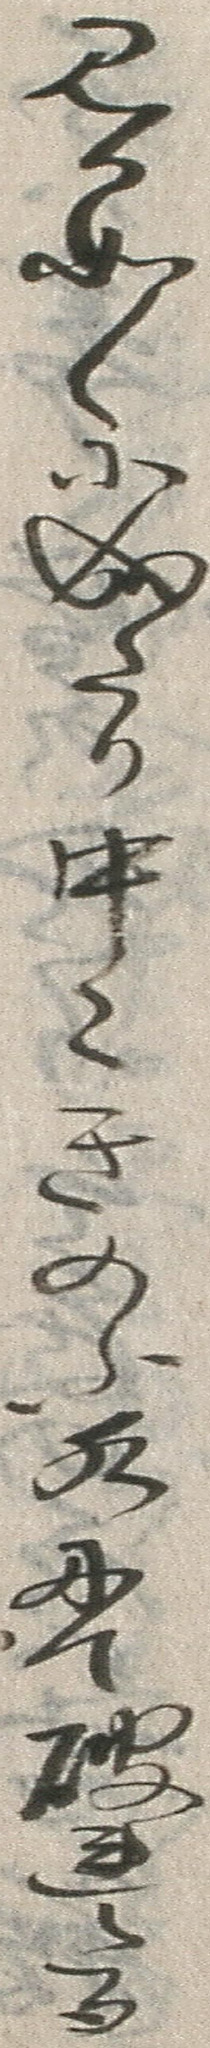見る如くに成たり中々きのふ水にて破れたる
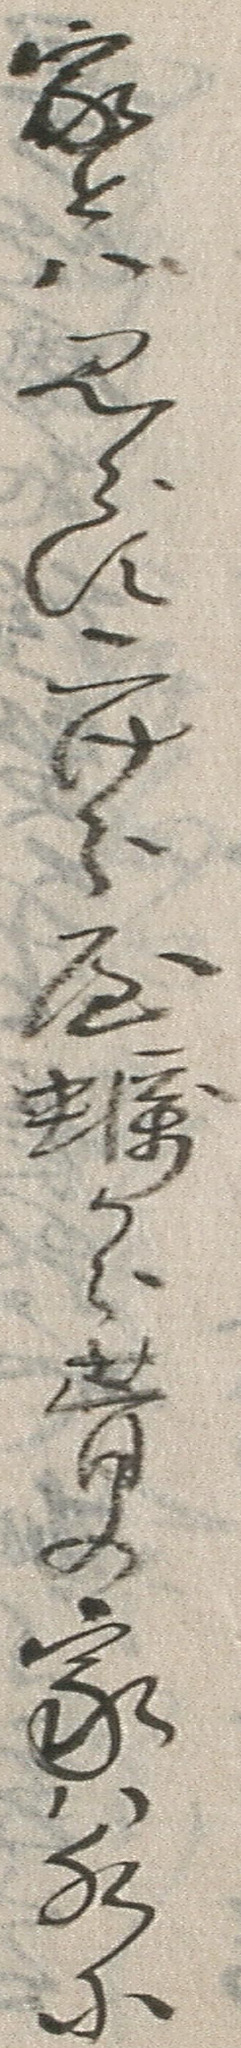家をは見らすこけら屋蠣から昔の家は水に
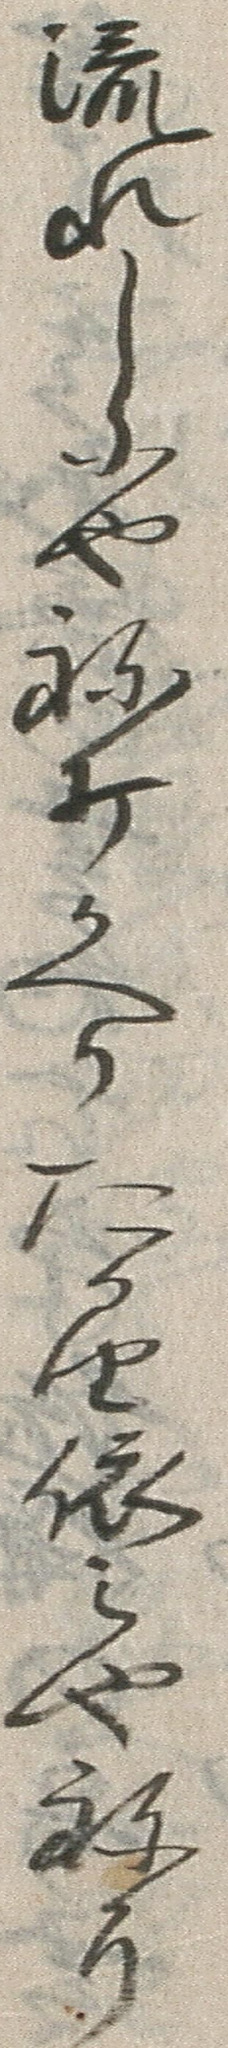流しにやね打かへりたる由依之やねに
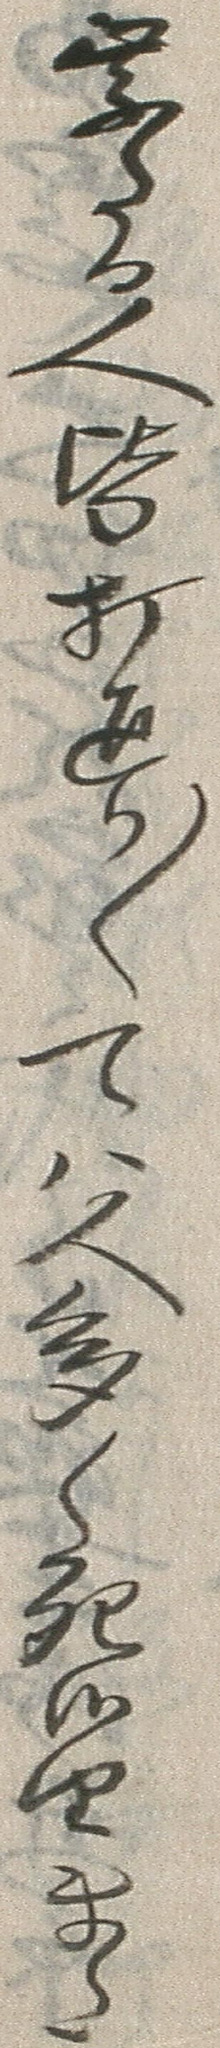乗たる人皆打返り〳〵ては人多く死候由また
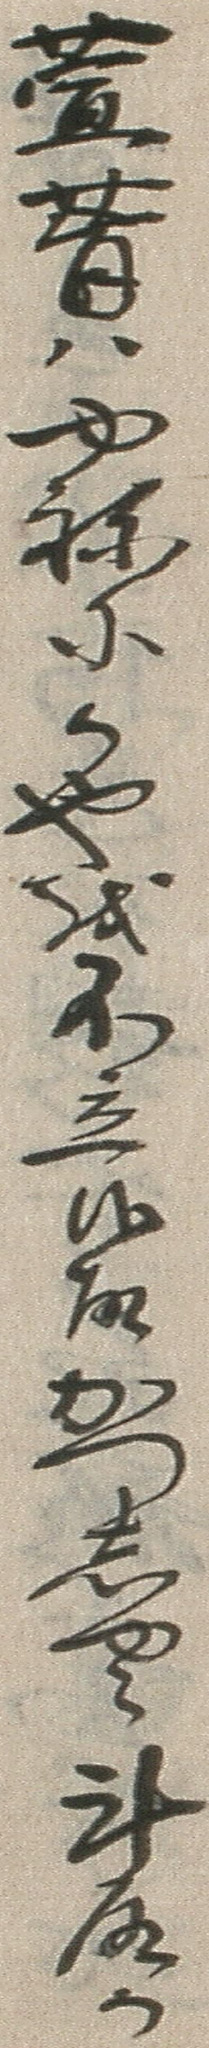萱葺はやねにかやを不立候故かつしやに斗故か
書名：享保十三年江戸洪水記
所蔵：東京大学地震研究所図書室 Earthquake Research Institute Library, The University of Tokyo, JAPAN
